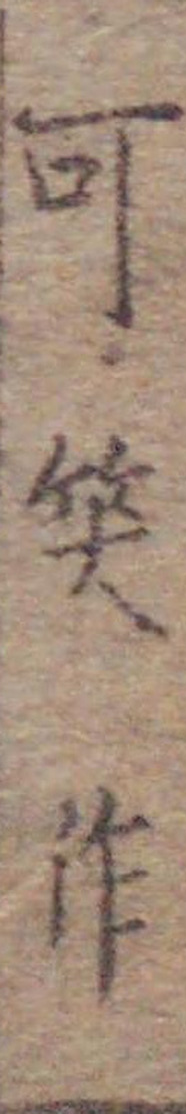可笑作
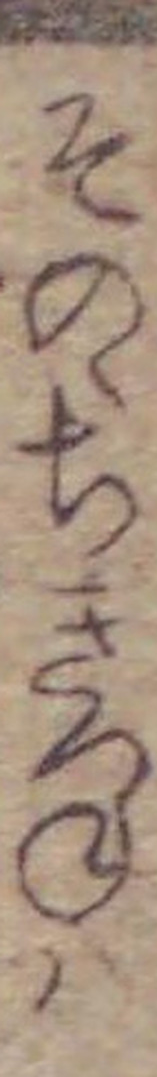そのゝちきつねは
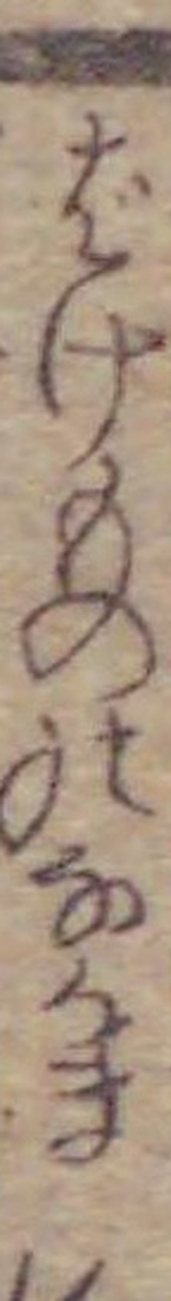ばけもののなかま
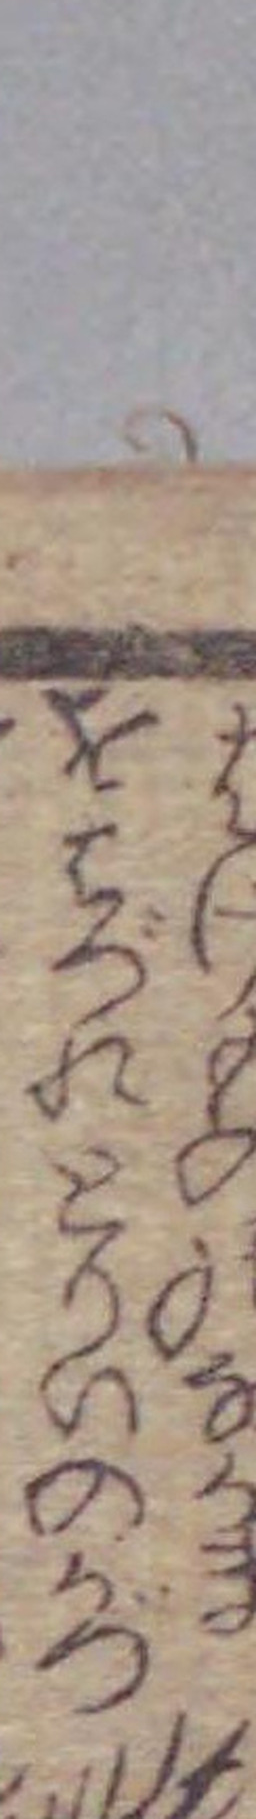をはづれとりいのかづ
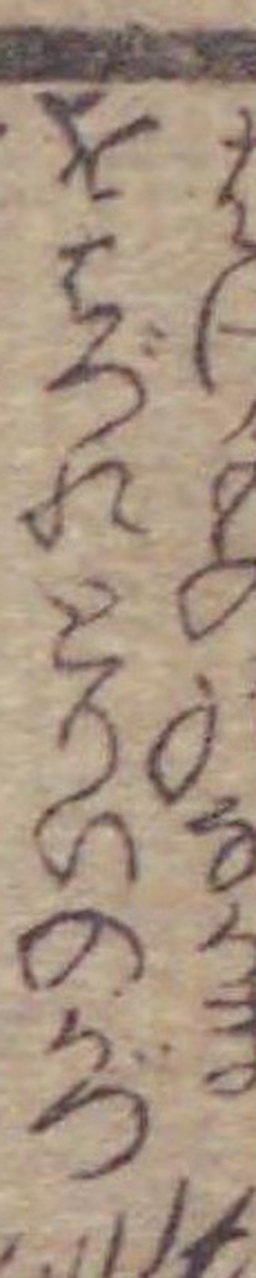をはづれとりいのかづ
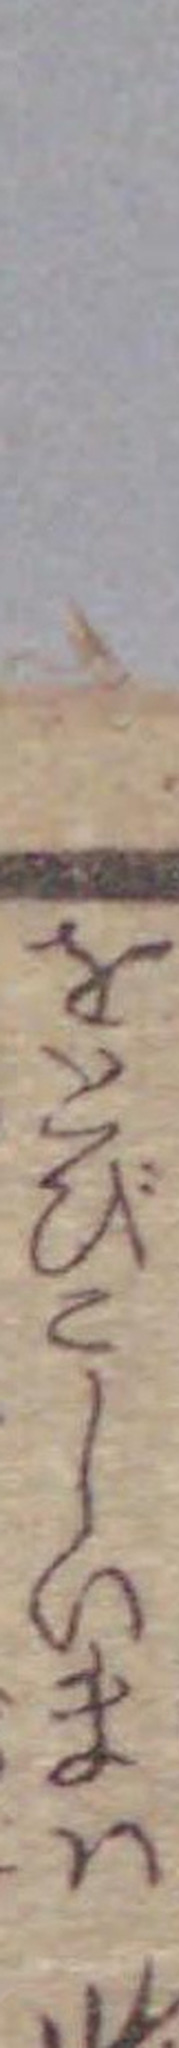をとびこしいまは
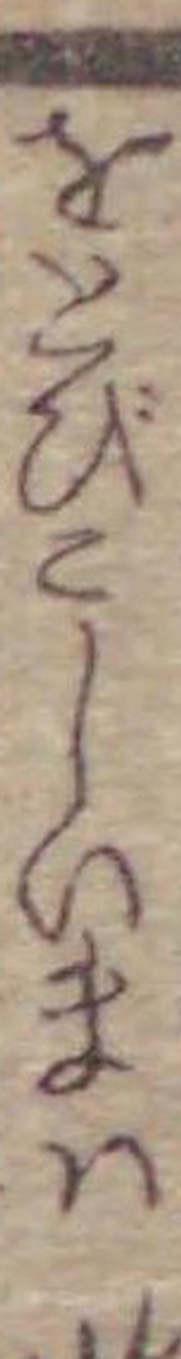をとびこしいまは
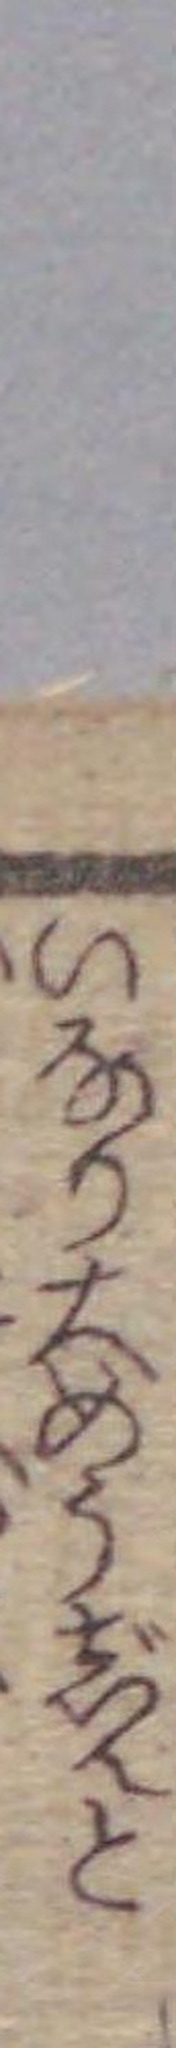いなり大めうじんと
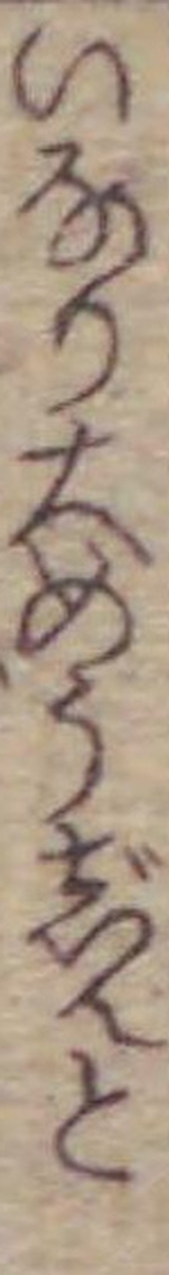いなり大めうじんと
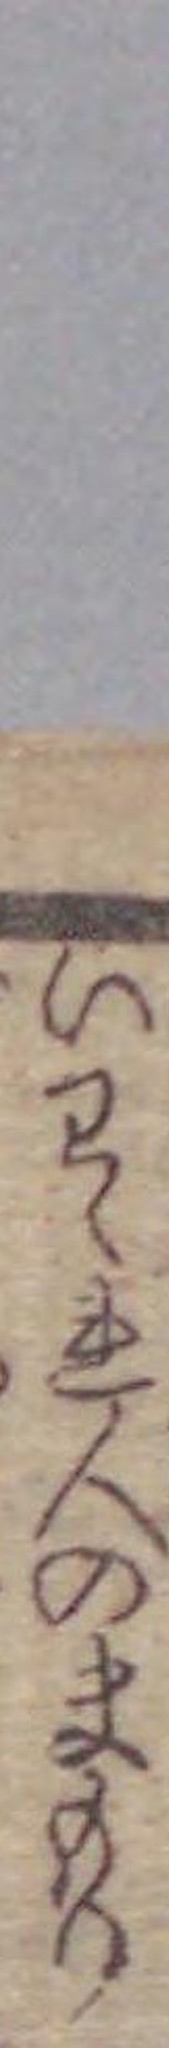いわゝれ人のまもり
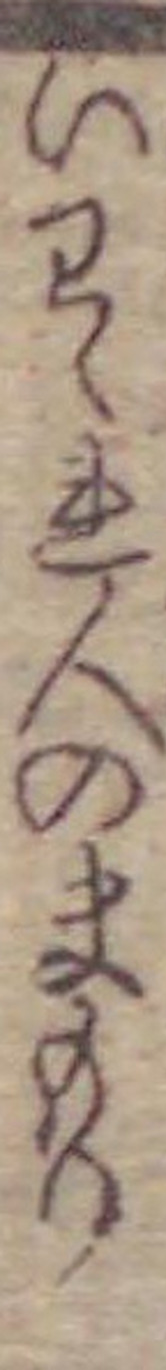いわゝれ人のまもり
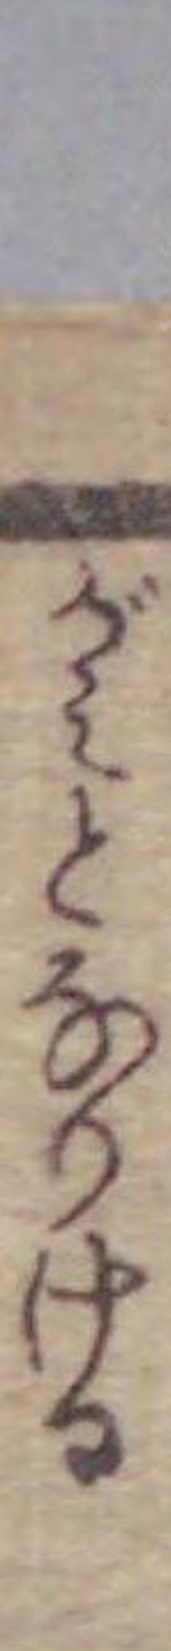がみとなりける
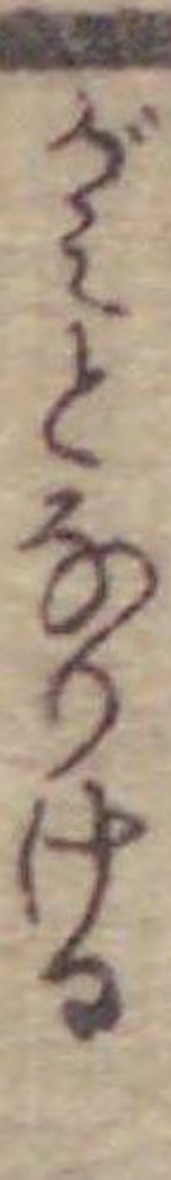がみとなりける
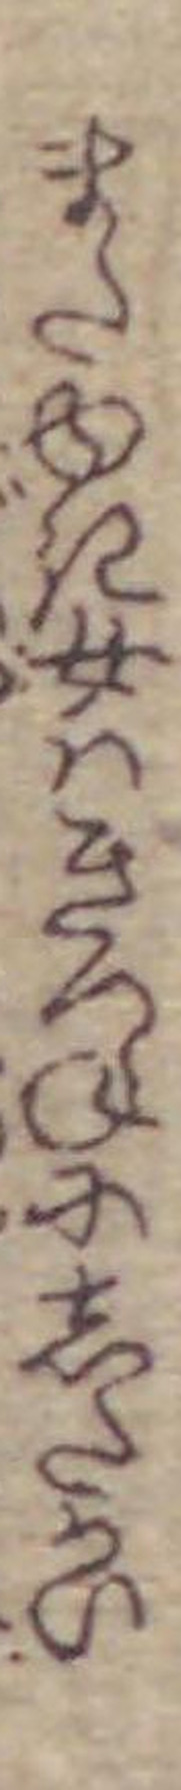またゆき女はきつねにしたかい
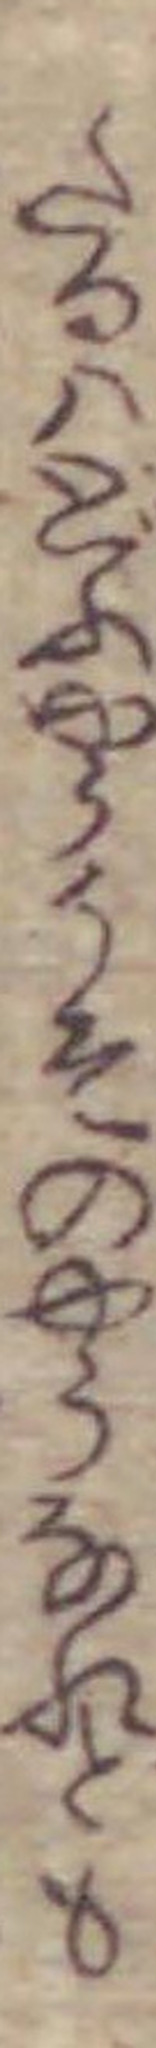たるはどふやらうそのやうなれども
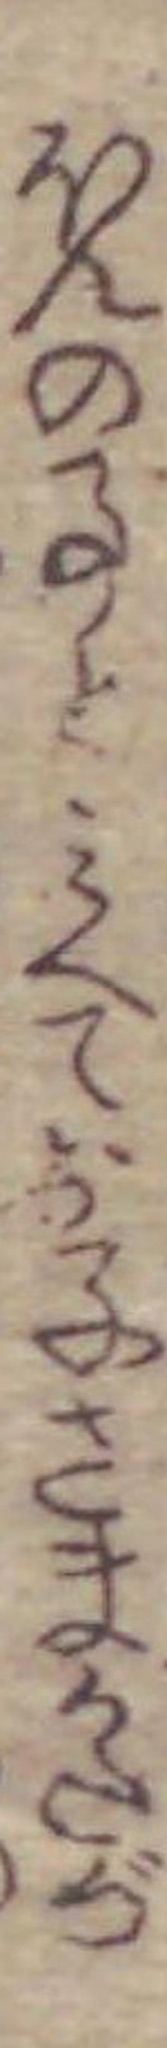ほんの事とみへてお子さまかたが
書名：化物仲間破 : 2巻
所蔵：国立国会図書館 National Diet Library, JAPAN
